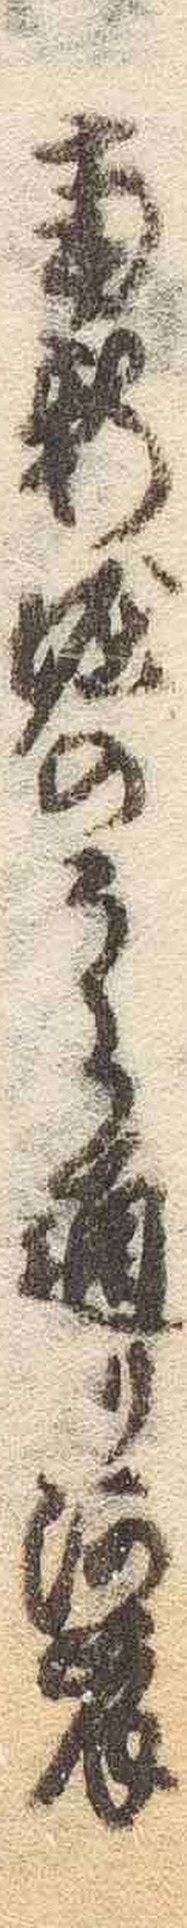南新堀のうら通り河岸
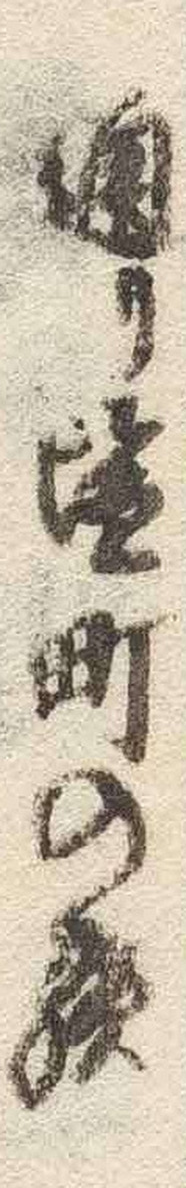通り塩町の続
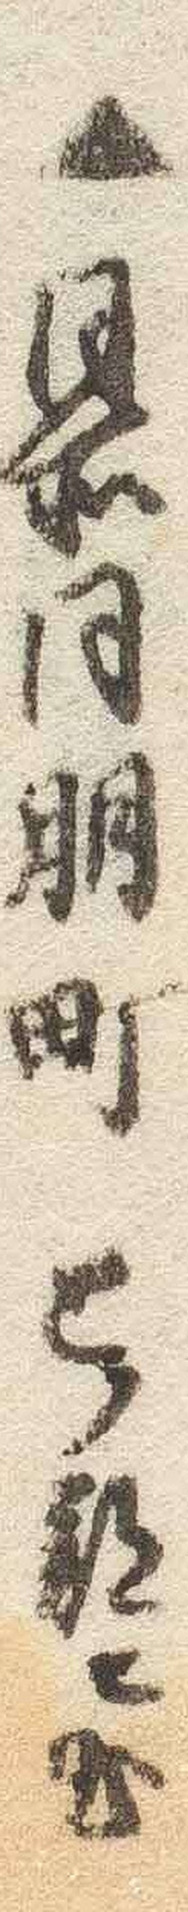▲同所同朋町とノ部に出
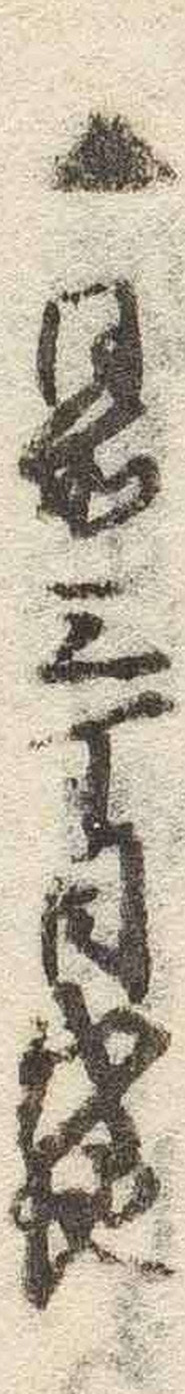▲同所三丁目代地
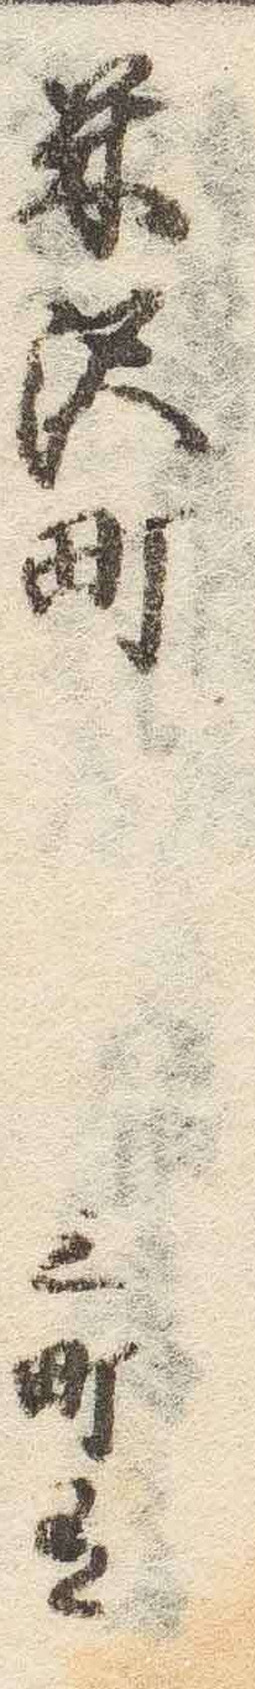米沢町三町有
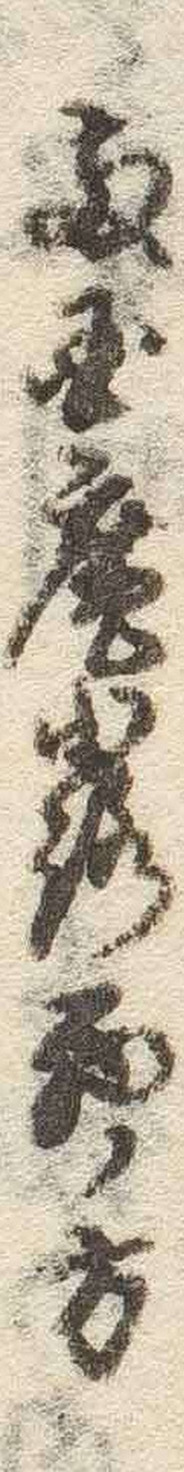両国広小路西ノ方
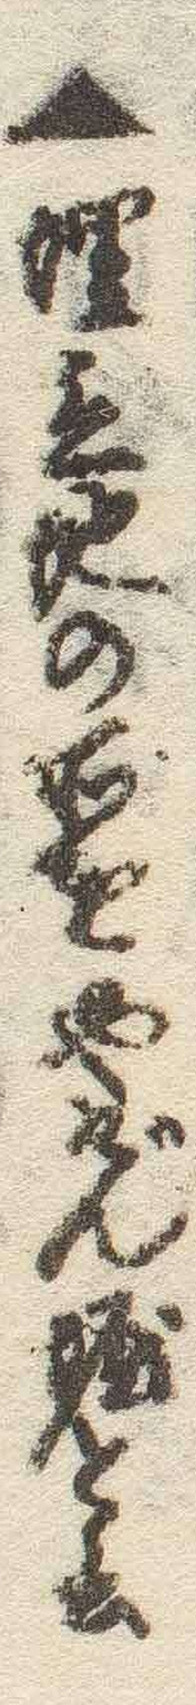▲埋立地の所をやげん堀と云
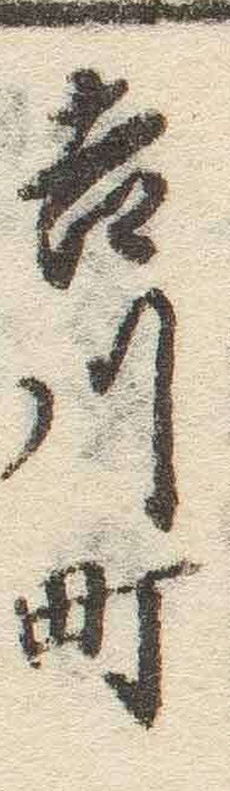吉川町
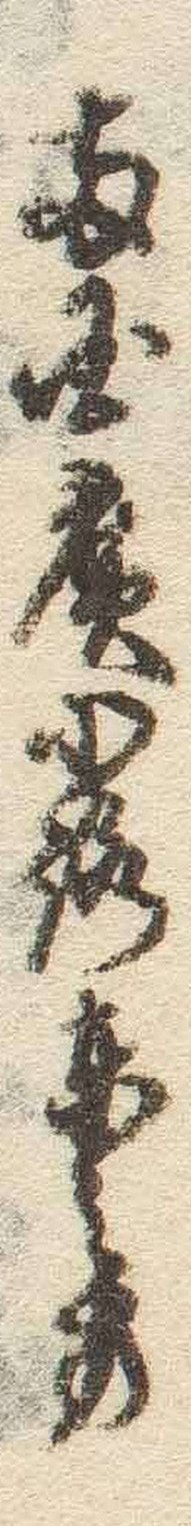両国広小路東之方
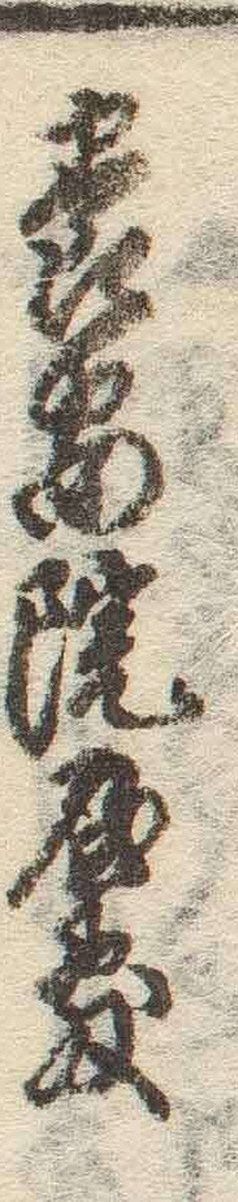養安院屋敷
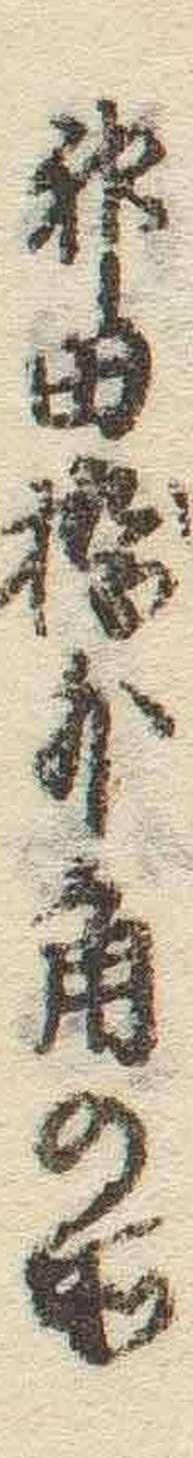神田橋外角の所
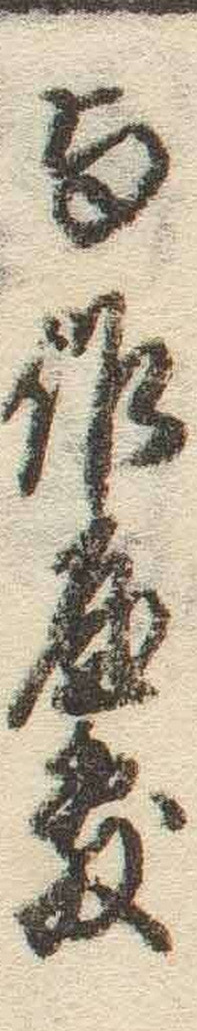与作屋敷
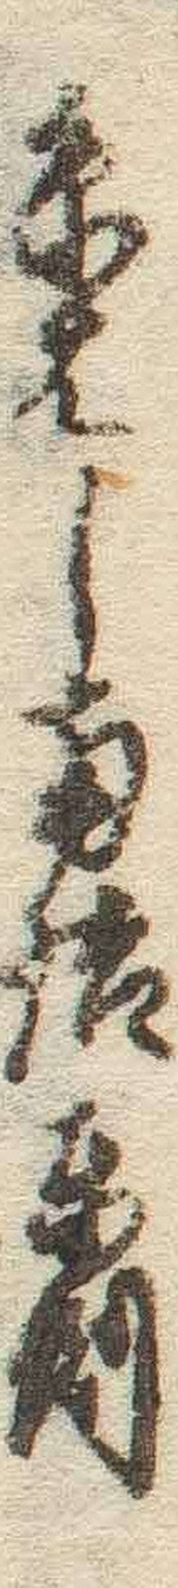京はし南詰東側
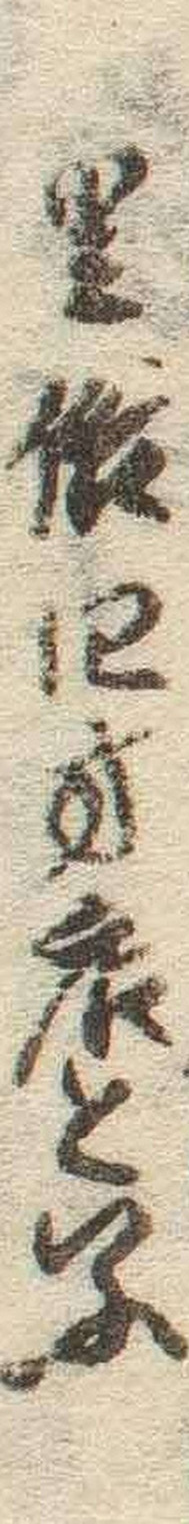里俗四方店といふ
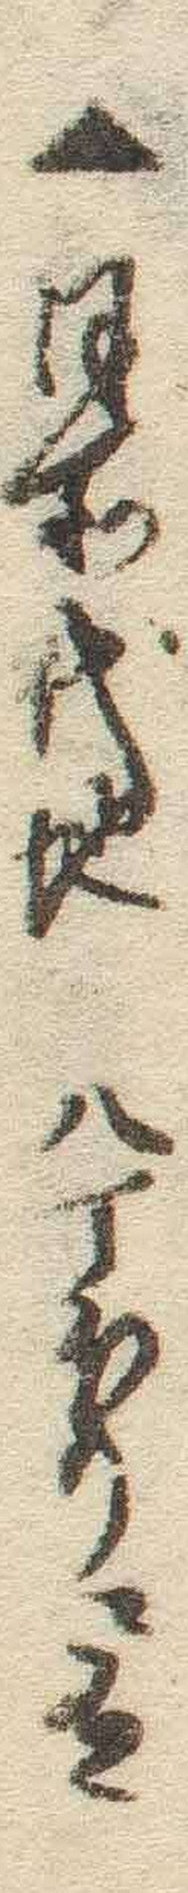▲同所代地八丁ほりに有
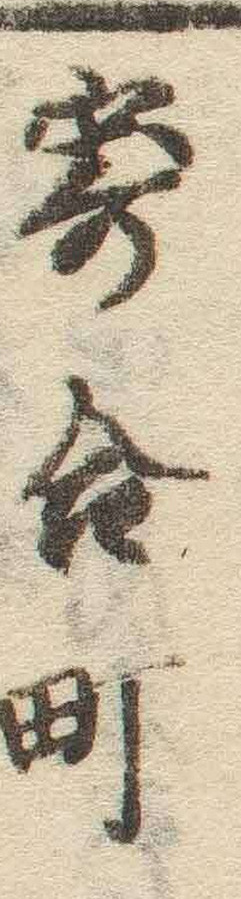寄合町
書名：江戸町独案内
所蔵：東京学芸大学附属図書館 国文学研究資料館
